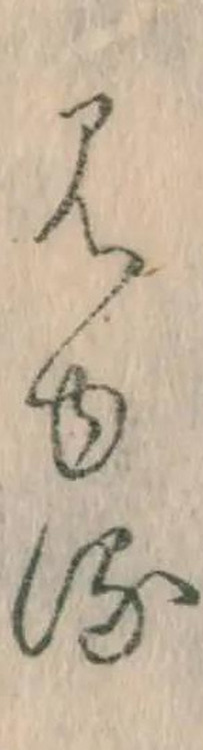見ゆる
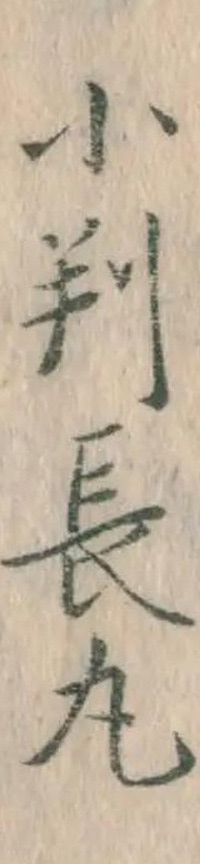小判長丸

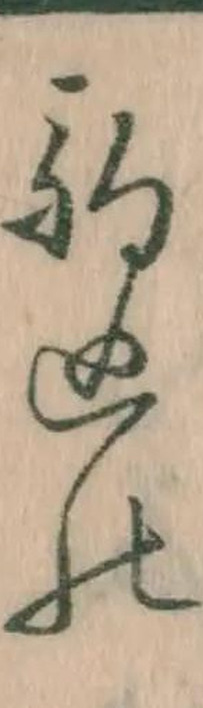駒込の
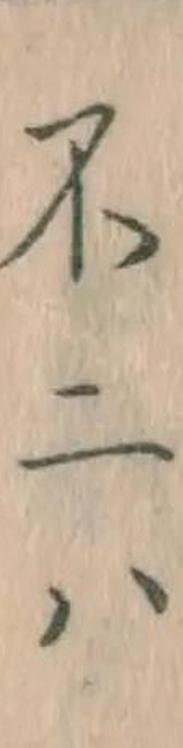不二は
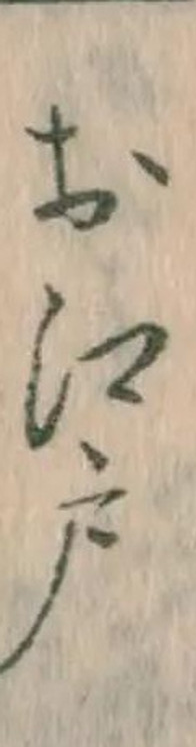お江戸

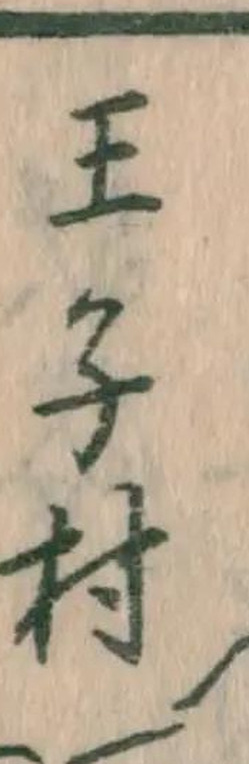王子村
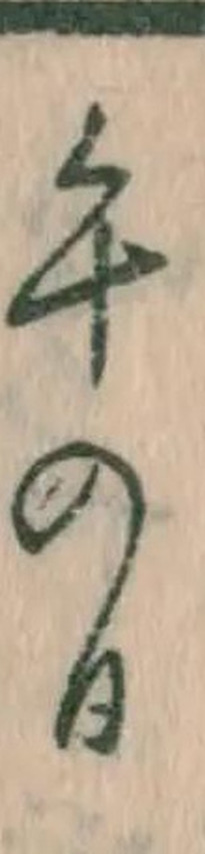午の日
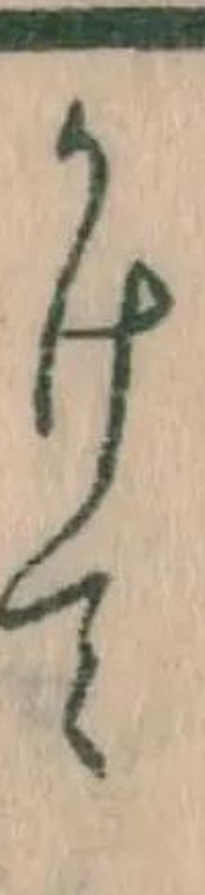かけて

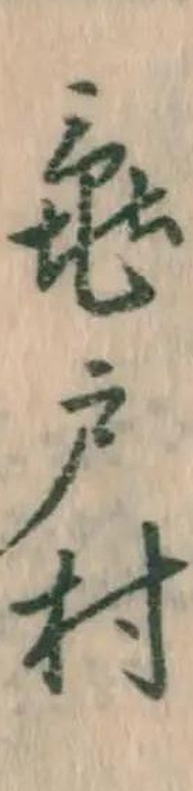亀戸村
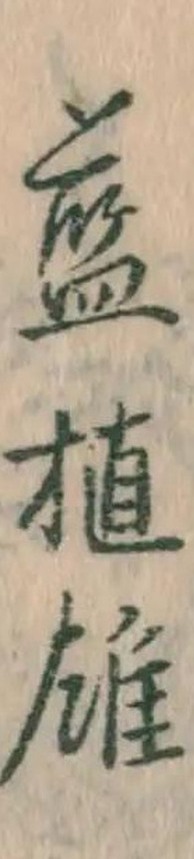藍植雄
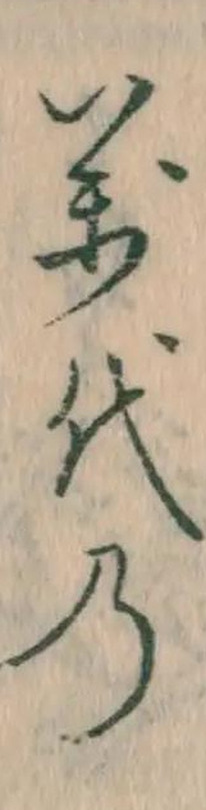万代の
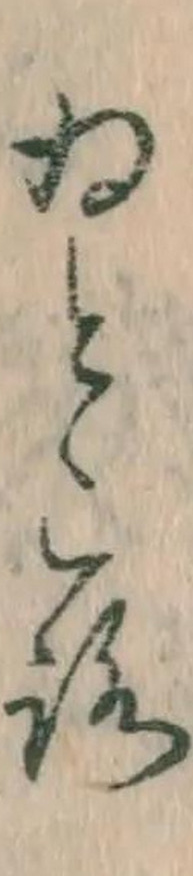ゐところ

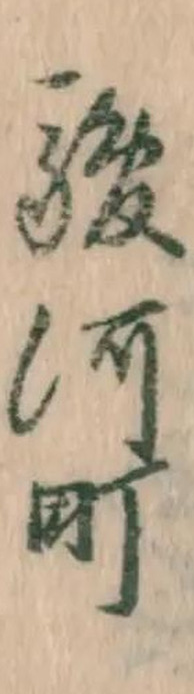駿河町
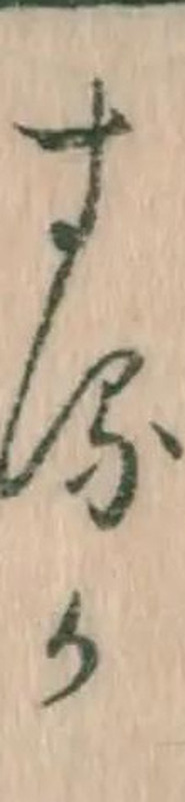するか
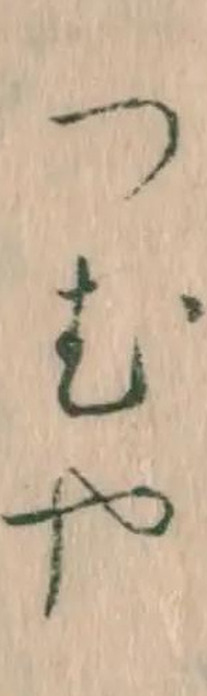つむや
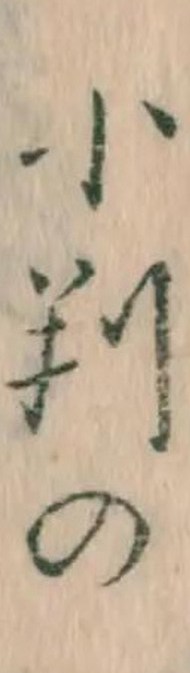小判の
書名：駿河舞 3巻
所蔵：国立国会図書館 National Diet Library, JAPAN
